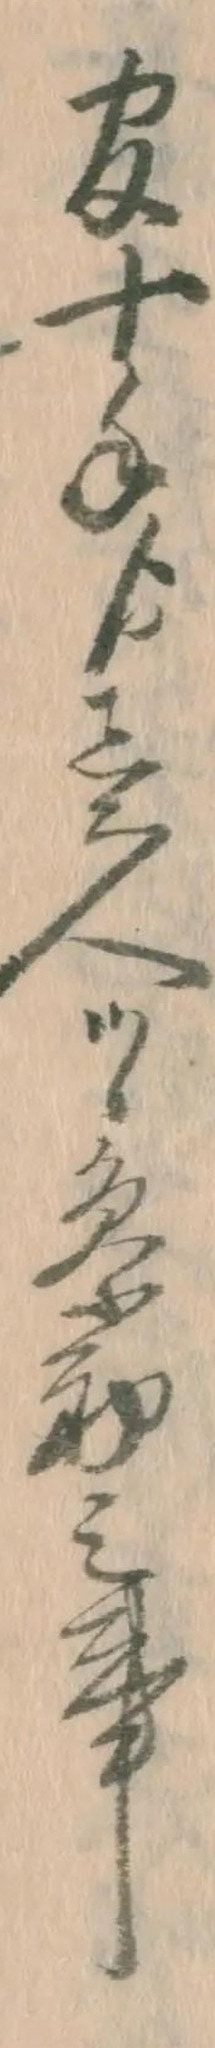官十手ゟ壱人ツヽ参勤之事
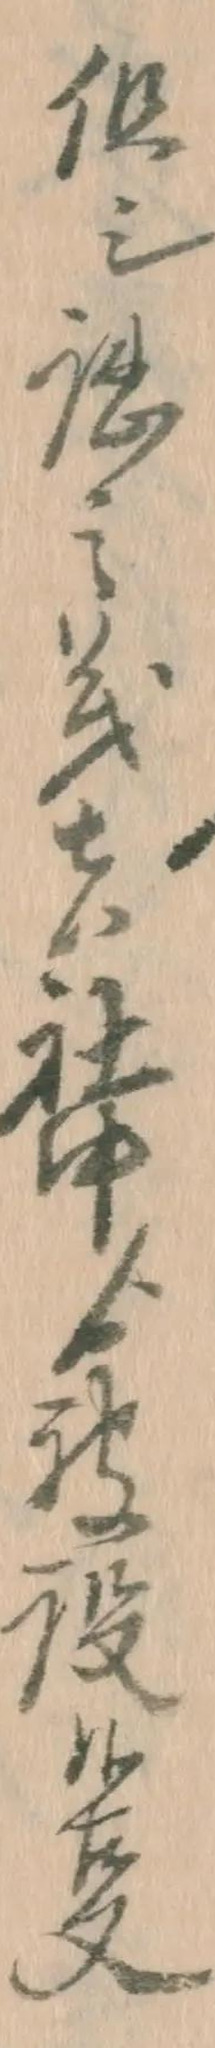但シ認之義は社中ゟ被設候事
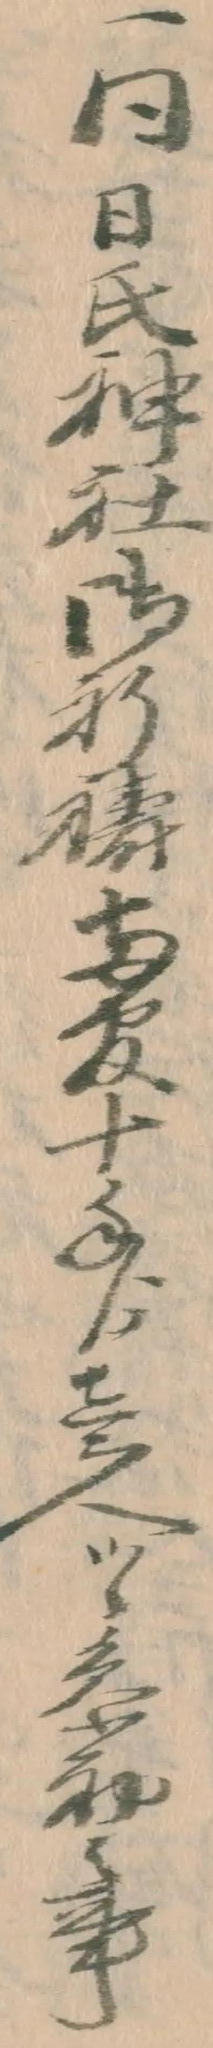一同日氏神社御祈祷両官十手ゟ壱人ツヽ参勤之事
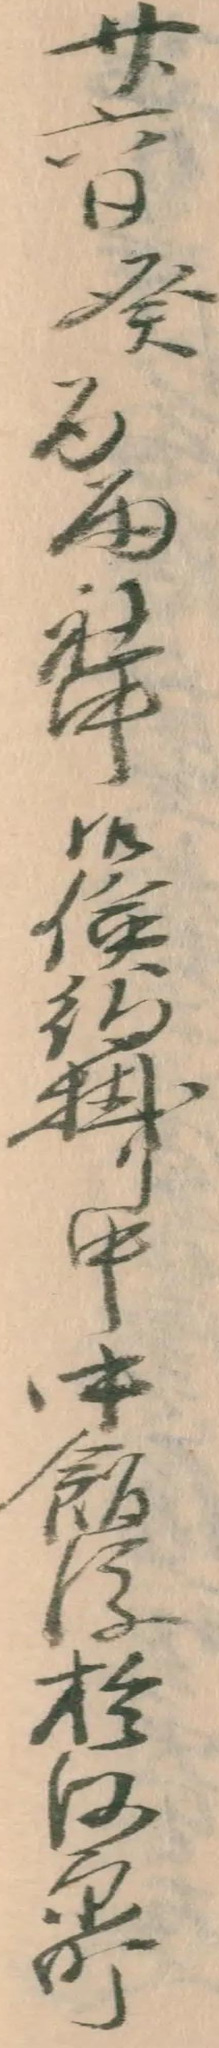廿六日癸酉雨社中御倹約掛り中中館後於河原町
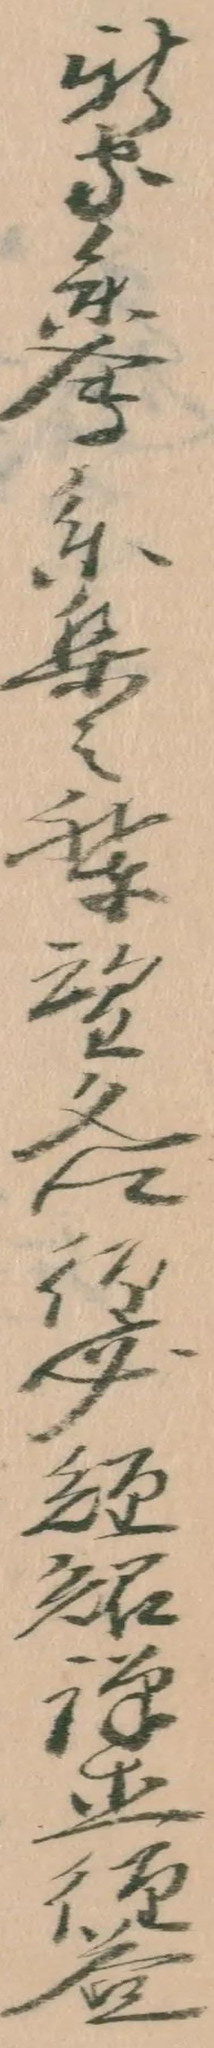新家参會参集之輩望久卿経必経紹謙譲直経益
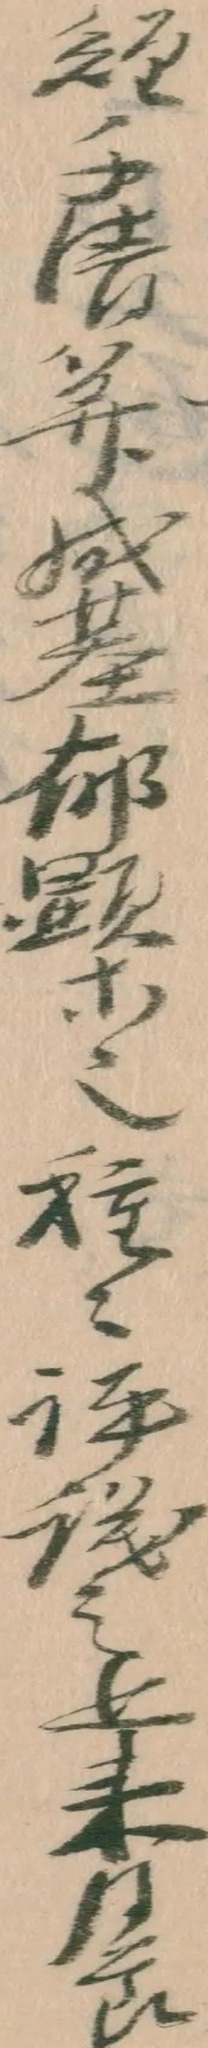経千清算成基郁顕等也種々評議之上来月節
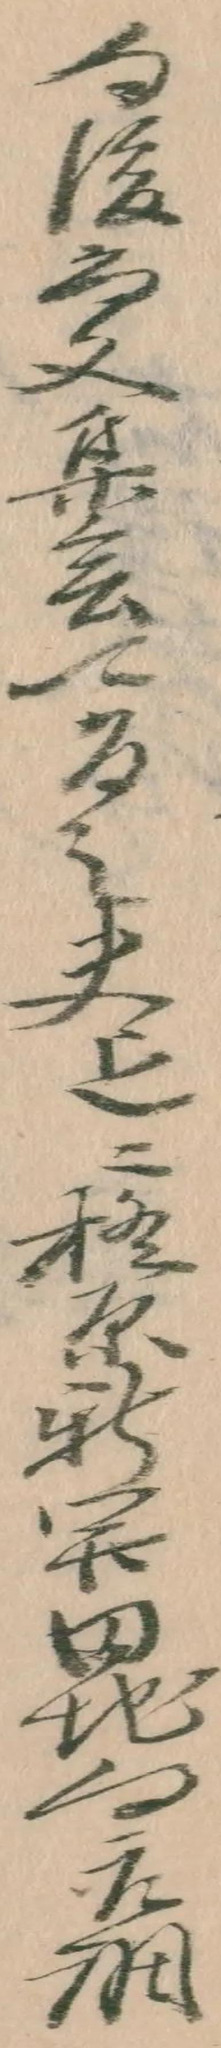旬後尚又集會可有之夫迄ニ柊原新開田地向取調
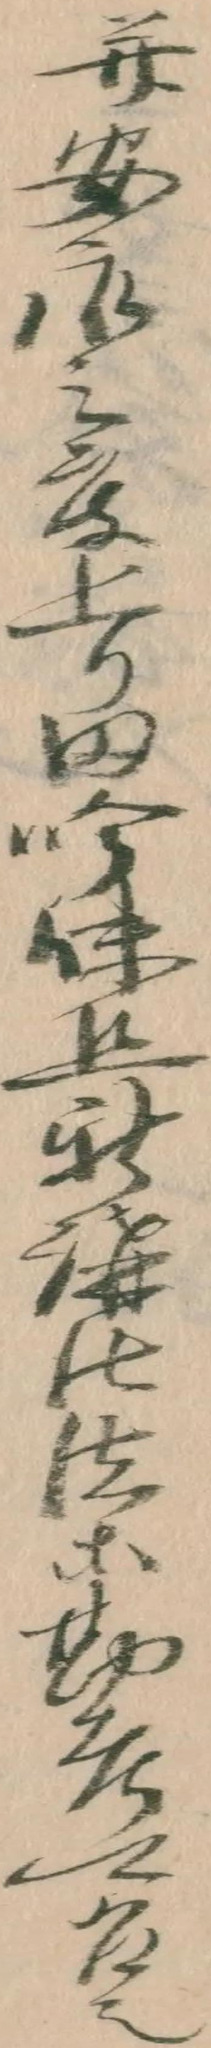并安永之度上り田吟味且新講仕法等勘考可有之
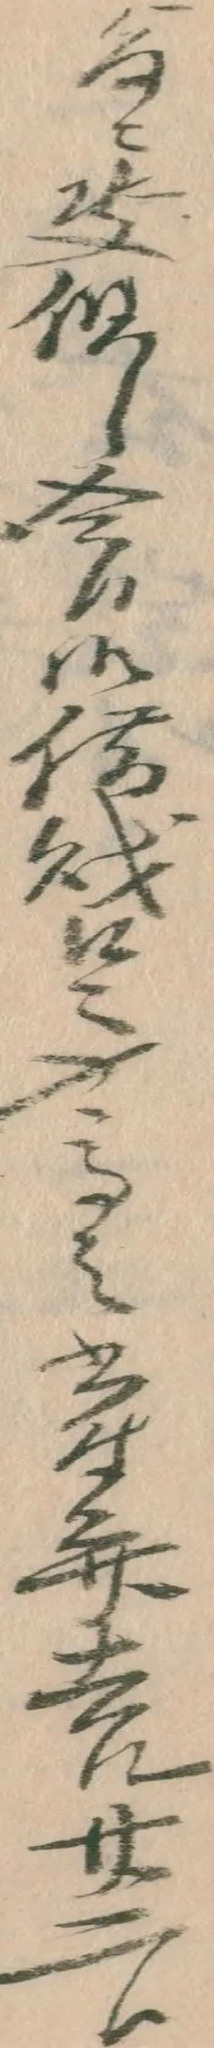間被決但し今日御借財口々〆高之書付弁去ル廿二日
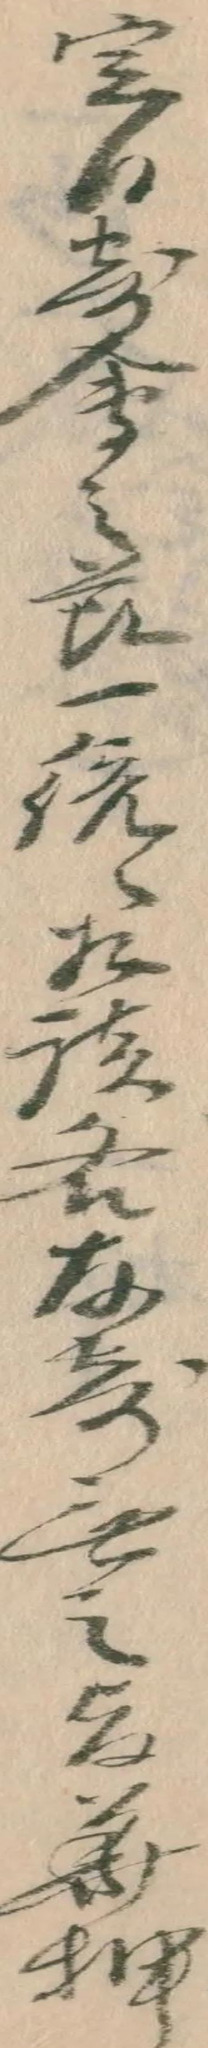定日寄會之節一統へ相談各存寄無之旨兼押
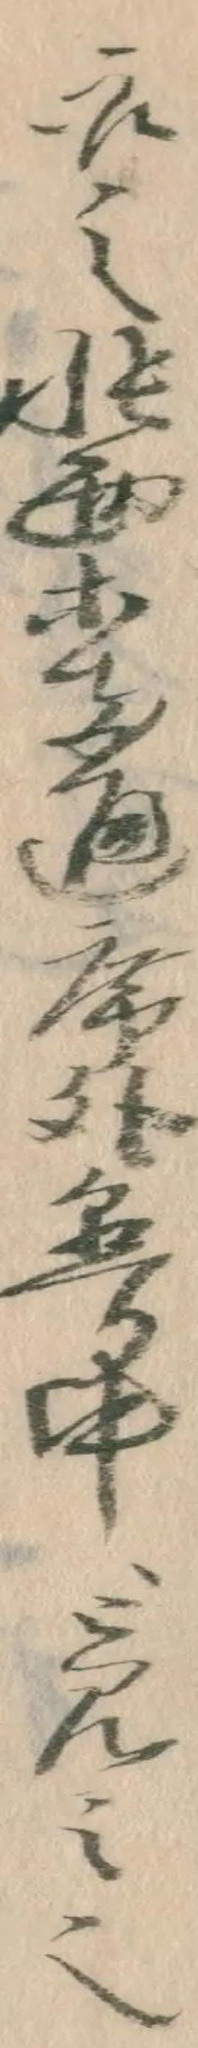取之帳面等両通席外懸り中へ御見之也
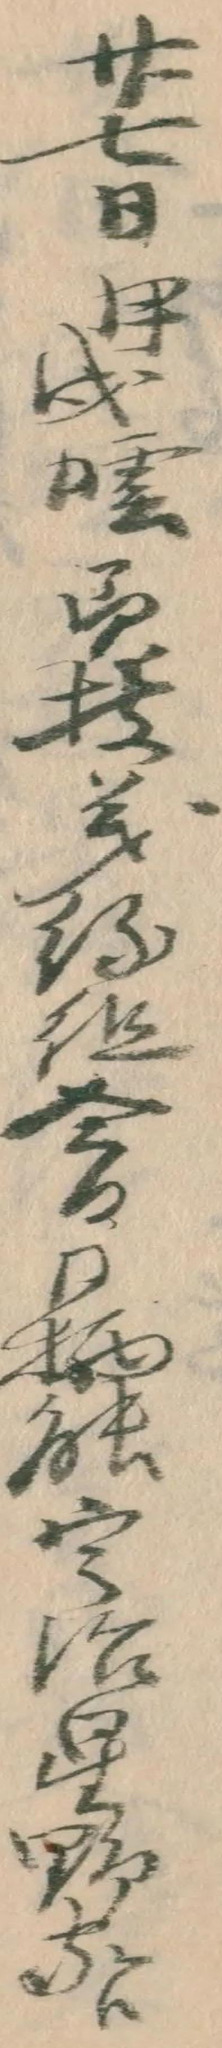廿七日甲戌晴美枝義縁組今日柄能宇治星野家え
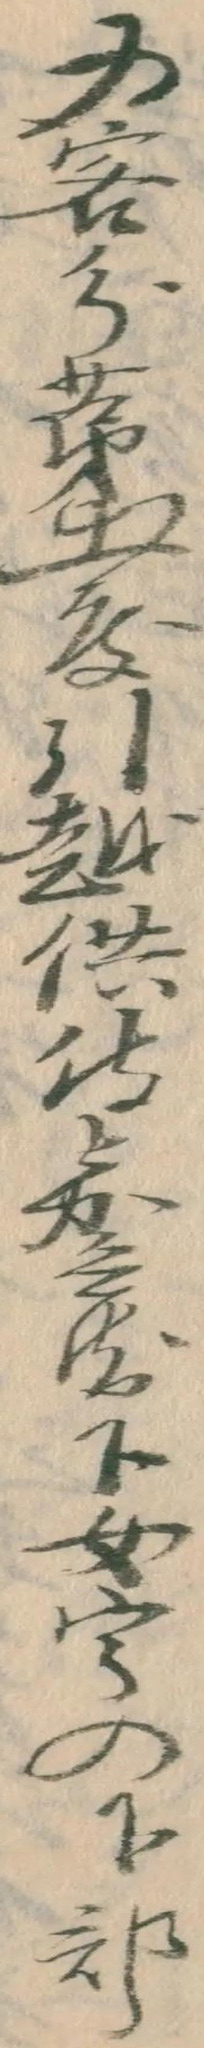為客分芽出度引越供侍嘉兵衛下女うの下部
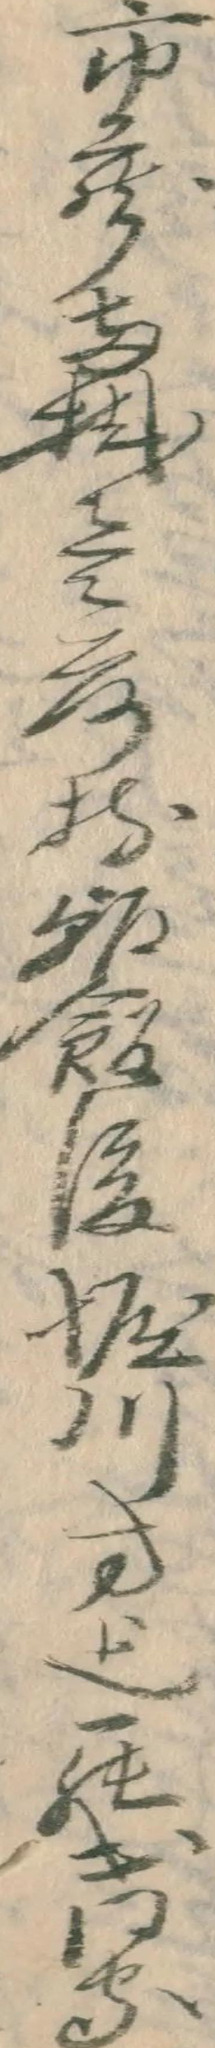市蔵両掛壱荷持朝飯後堀川方迄罷出同家
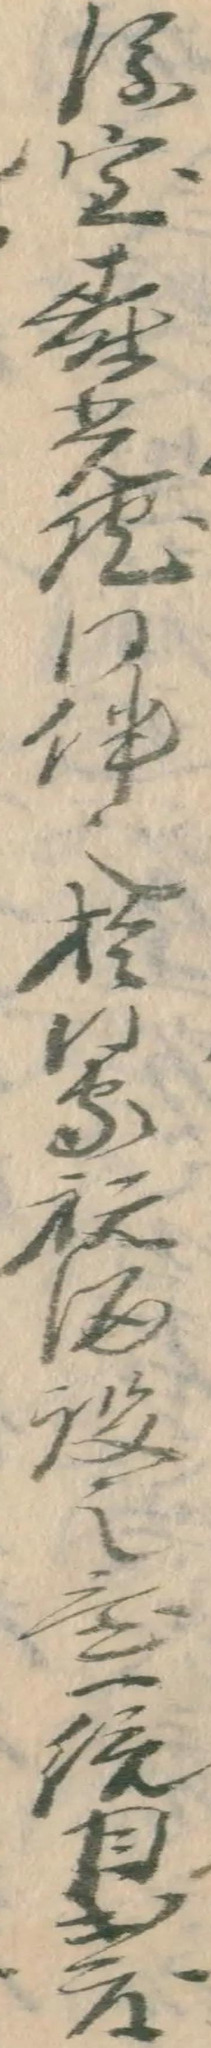後室壽光院同伴也於同家祝酒設之置一統自出度
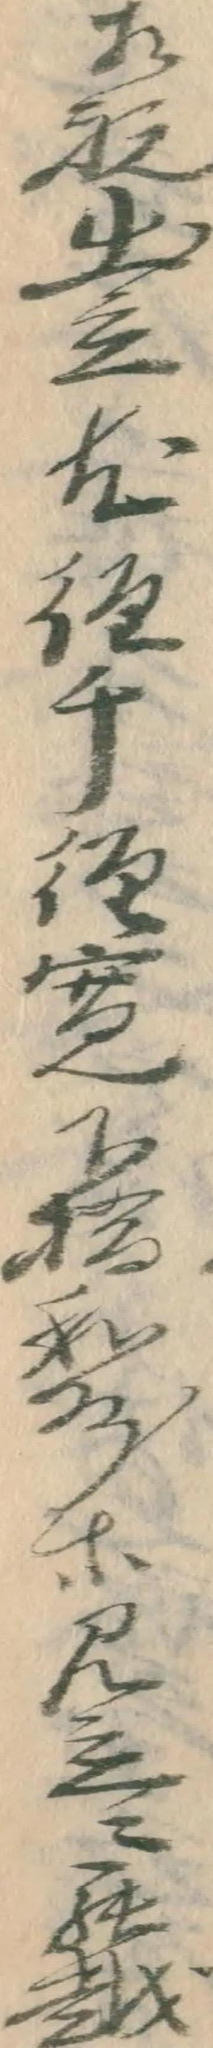相祝出立尤経千経寛下橋和州等見立に罷越
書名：賀茂社記録. 第67冊
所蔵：国立国会図書館 National Diet Library, JAPAN
